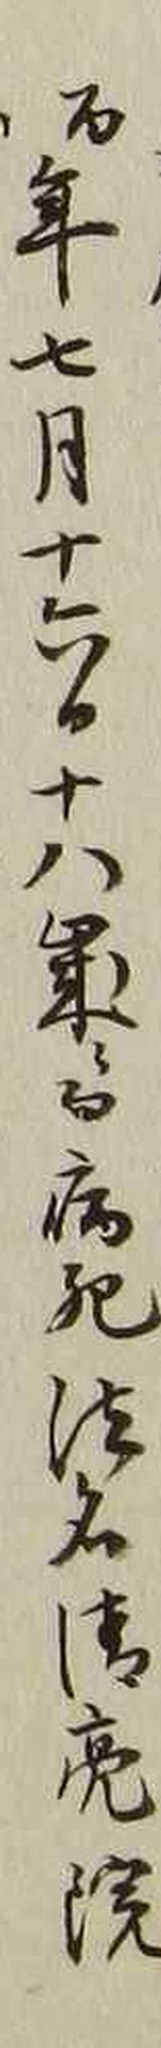女酉年七月十六日十八歳ニて病死法名清亮院
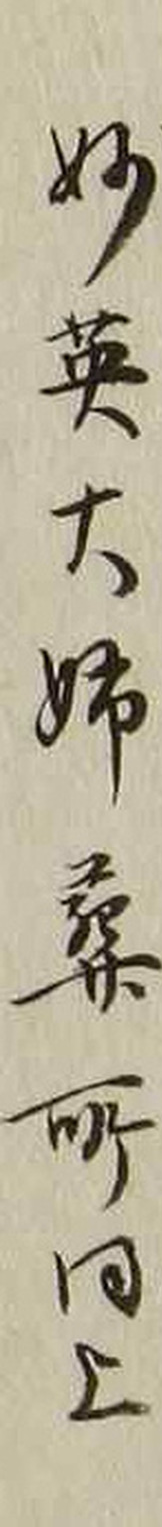妙英大姉葬所同上
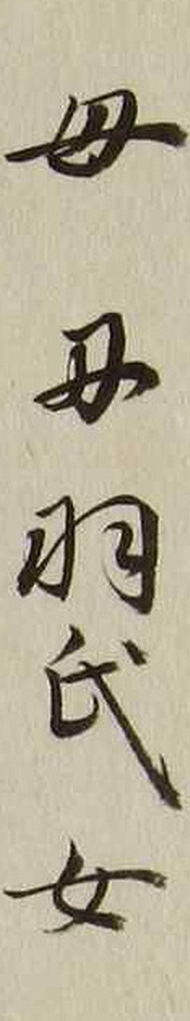母丹羽氏女
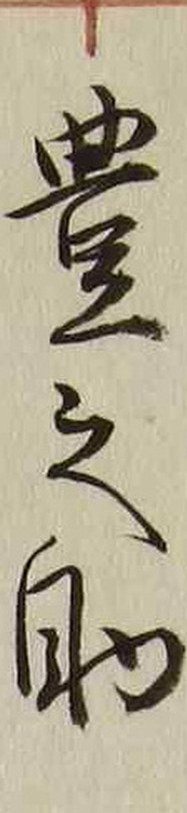豊之助
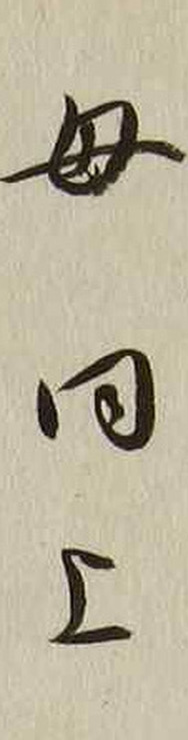母同上
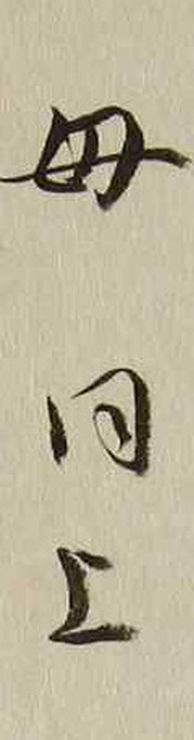母同上
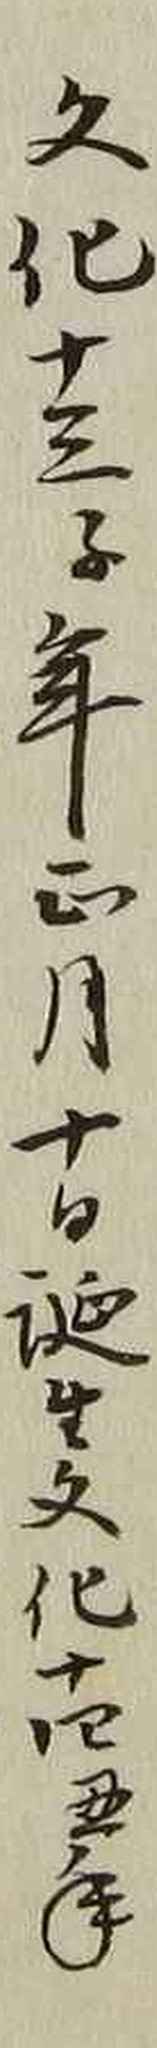文化十三子年正月十日誕生文化十四丑年
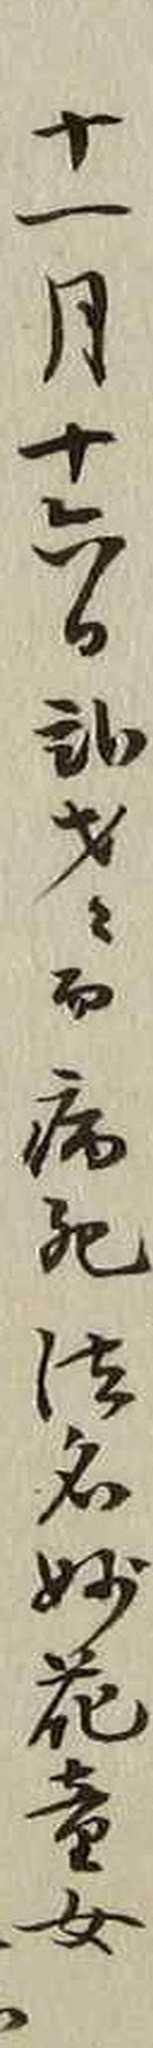女十一月十六日弐才ニて病死法名妙花童女
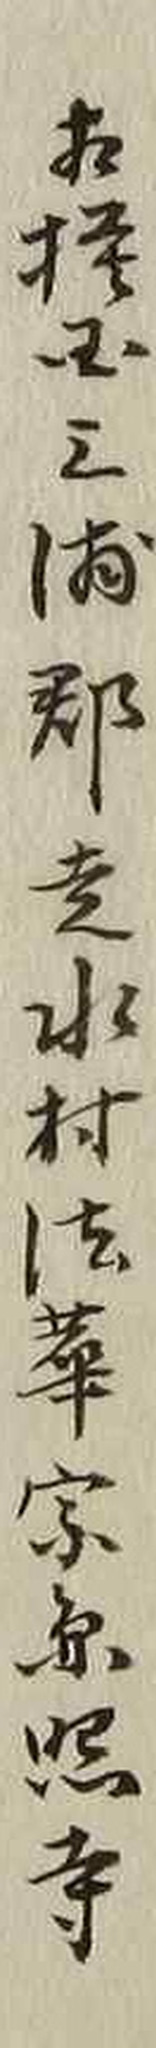相模国三浦郡走水村法華宗円照寺葬所
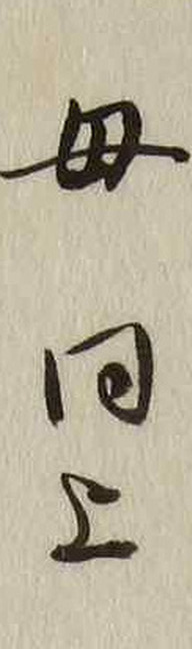母同上
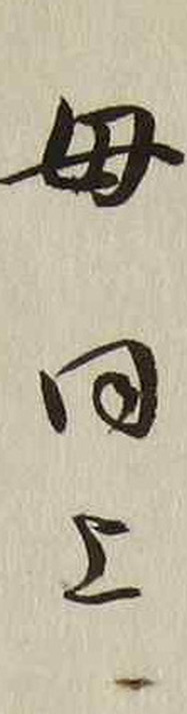母同上
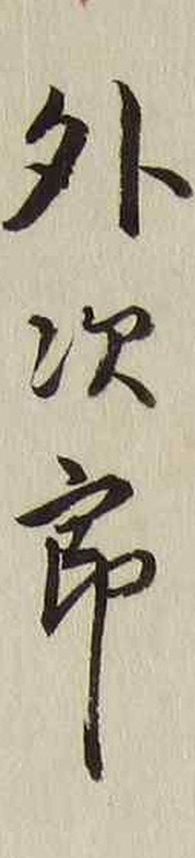外次郎
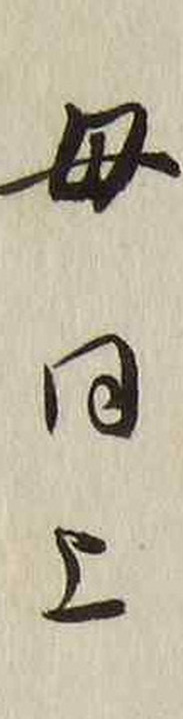母同上
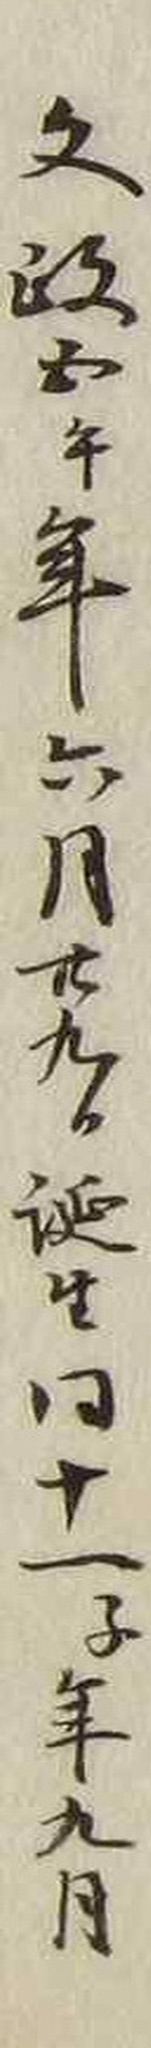文政五午年六月廿九日誕生同十一子年九月

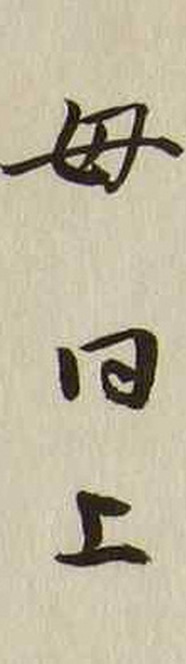母同上
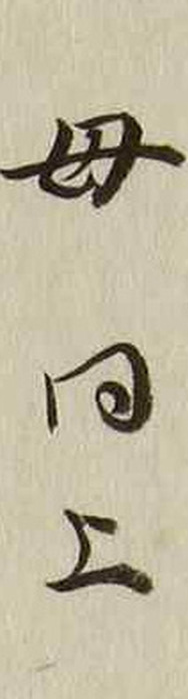母同上
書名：諸士系譜　巻之16　い之部16
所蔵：会津若松市立会津図書館
